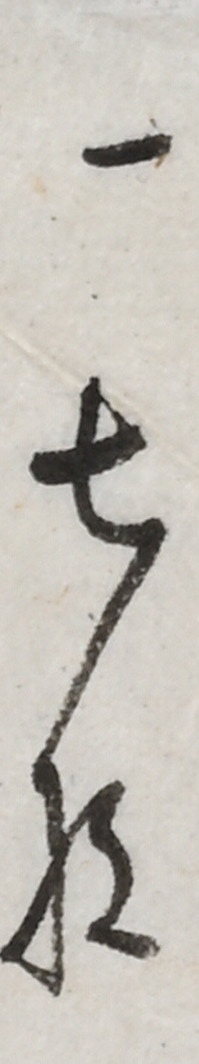一四枚
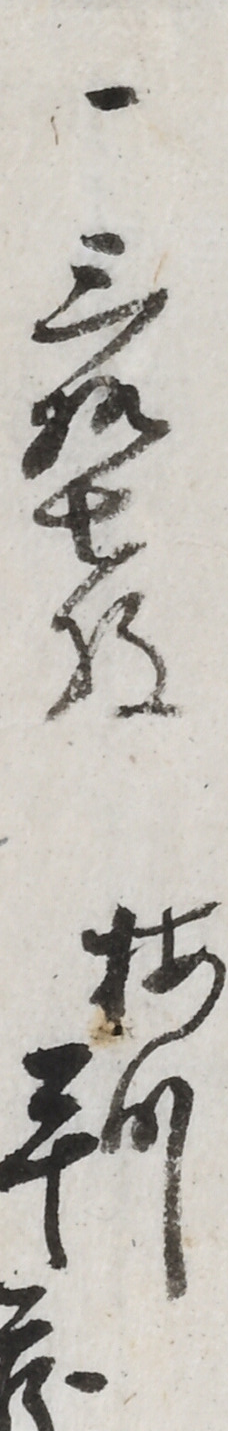一三拾七枚平蔵
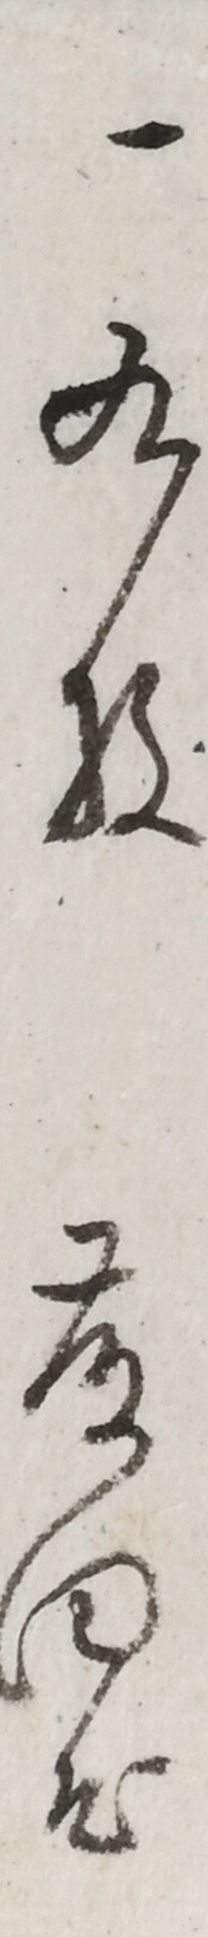一九枚藤田屋
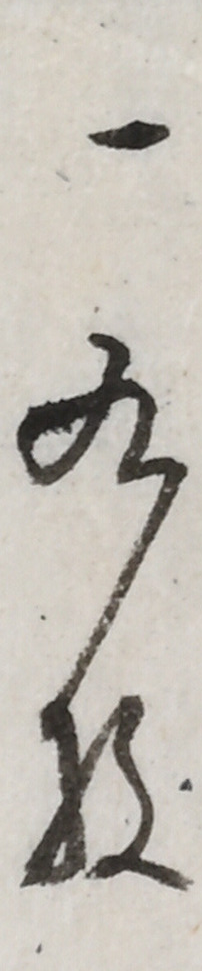一四枚
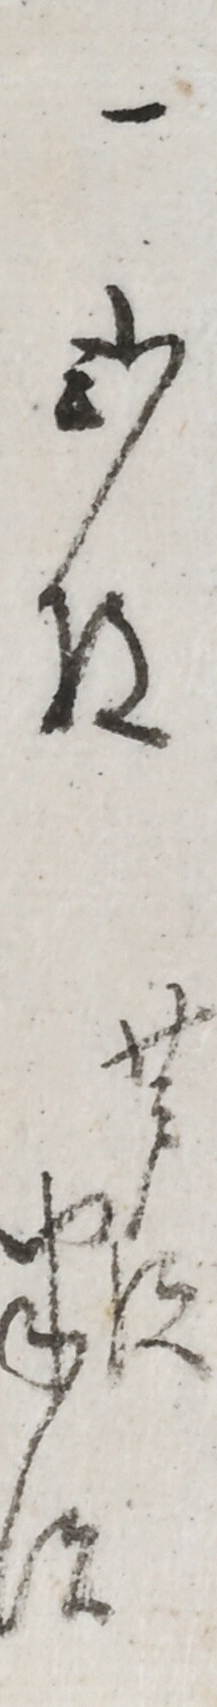一弐枚芦沢
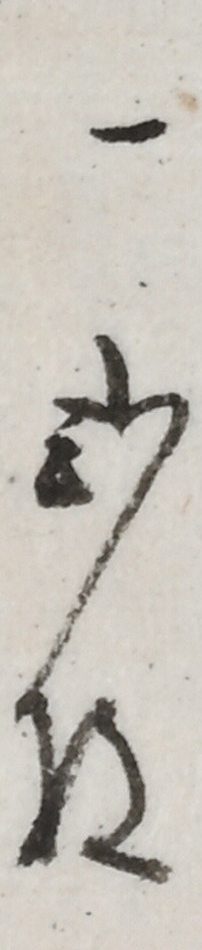一四枚
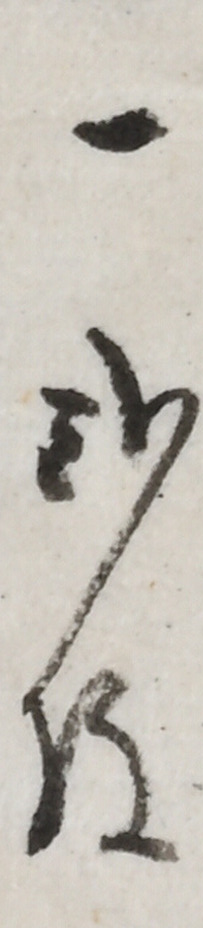一四枚
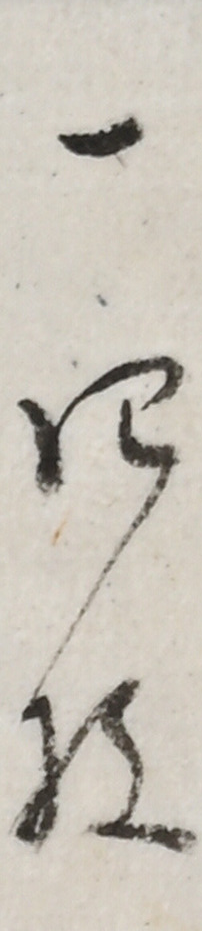一四枚
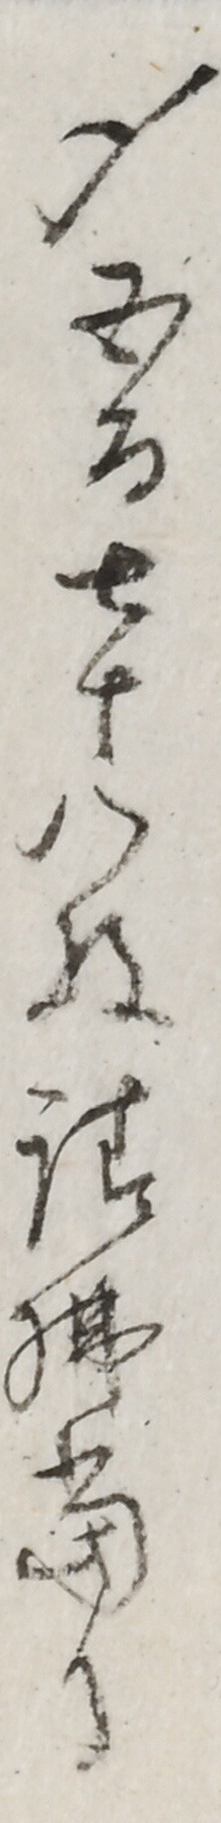〆五百七十八枚請払当り
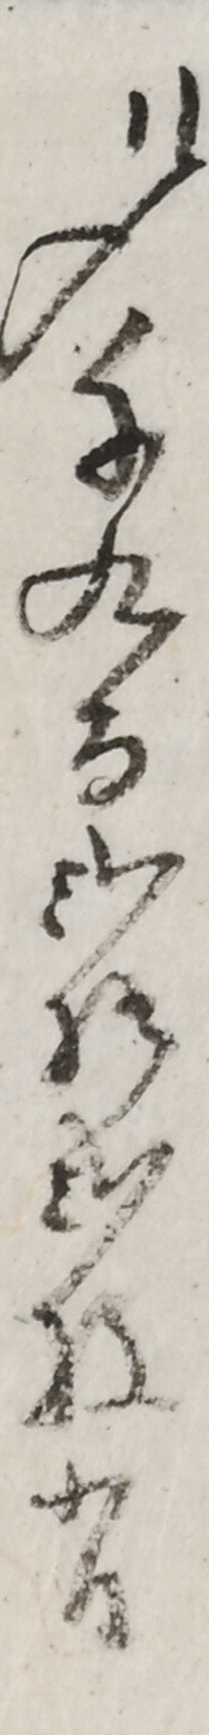〆千九百弐拾弐枚有
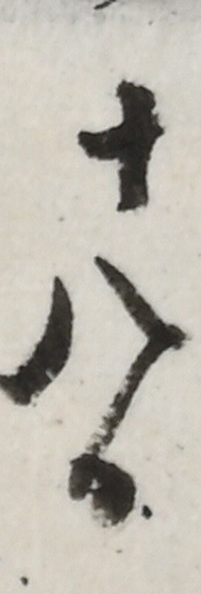十八日
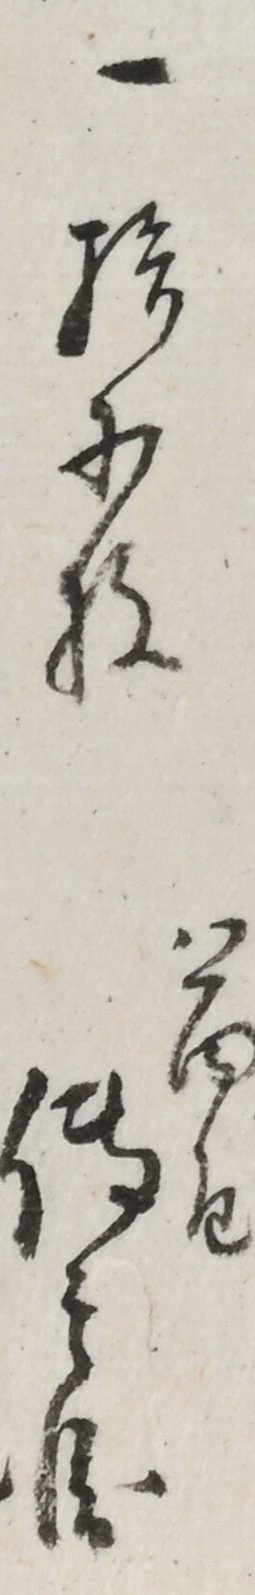一拾五枚伝兵衛

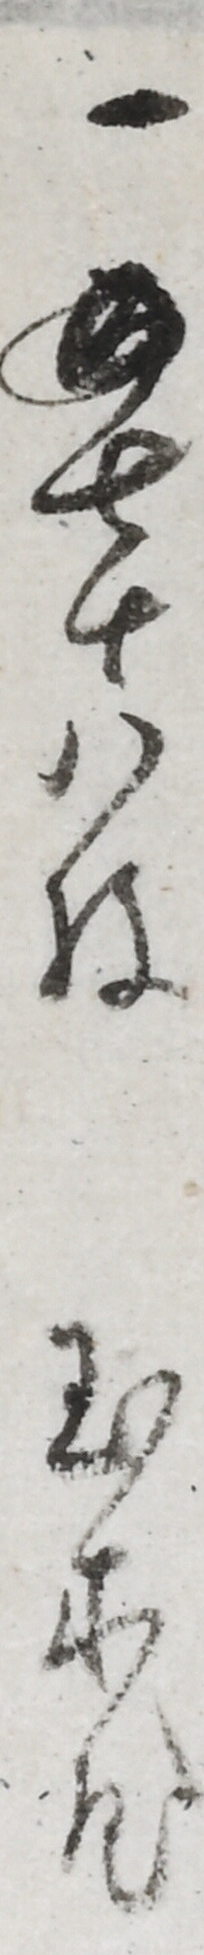一●七十八枚玉木屋
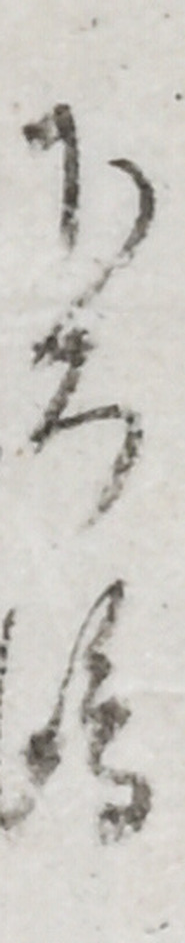下大嶋
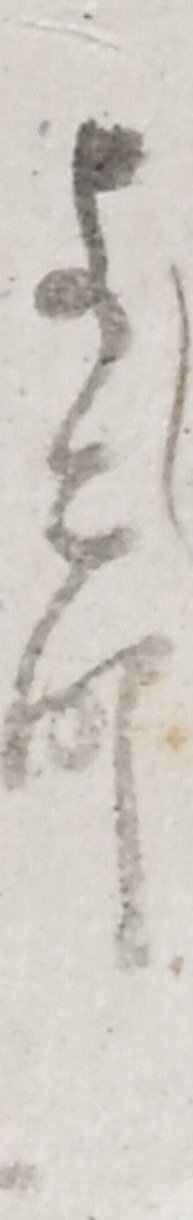よこ町
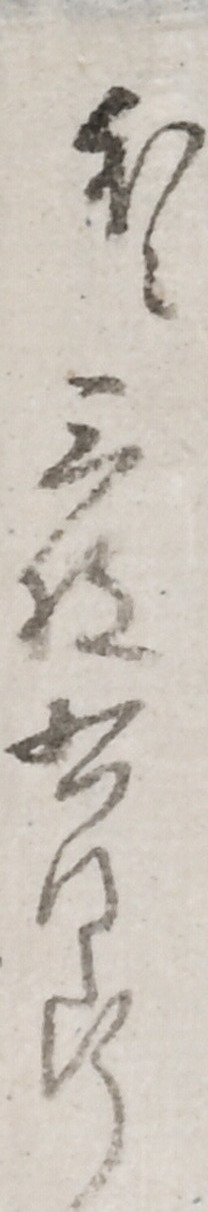外ニ三枚右同断
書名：髙遠限楮幣引換覚帳
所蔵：伊那市立高遠町図書館・合同会社AMANE
